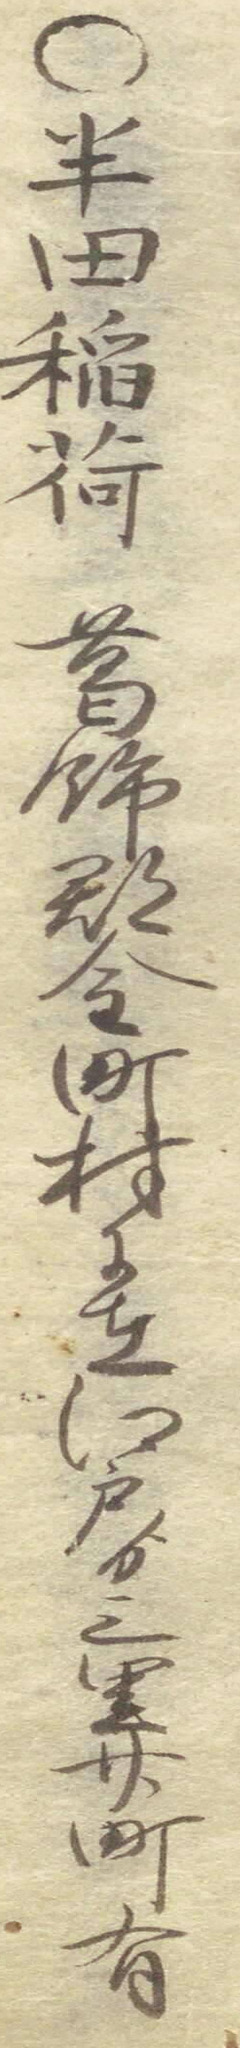○半田稲荷葛飾郡金町村に在江戸より三里廿町有
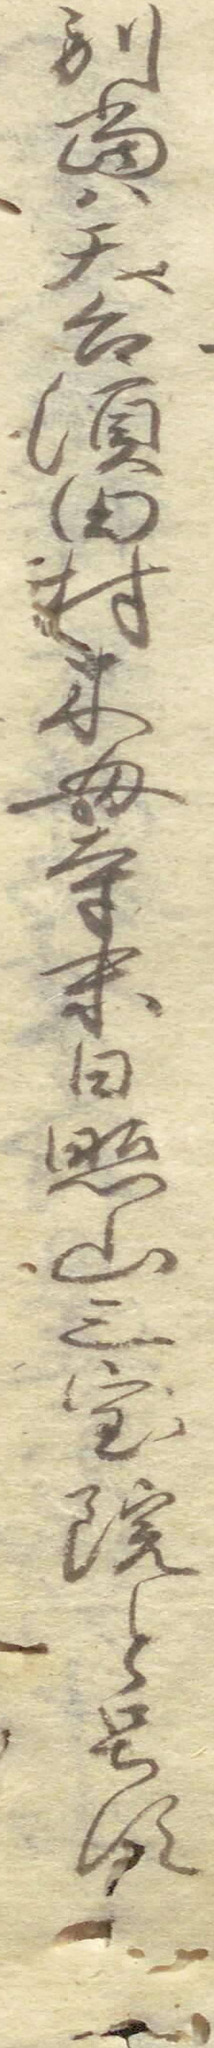別当は天台須田村木母寺末日照山三宝院と号す
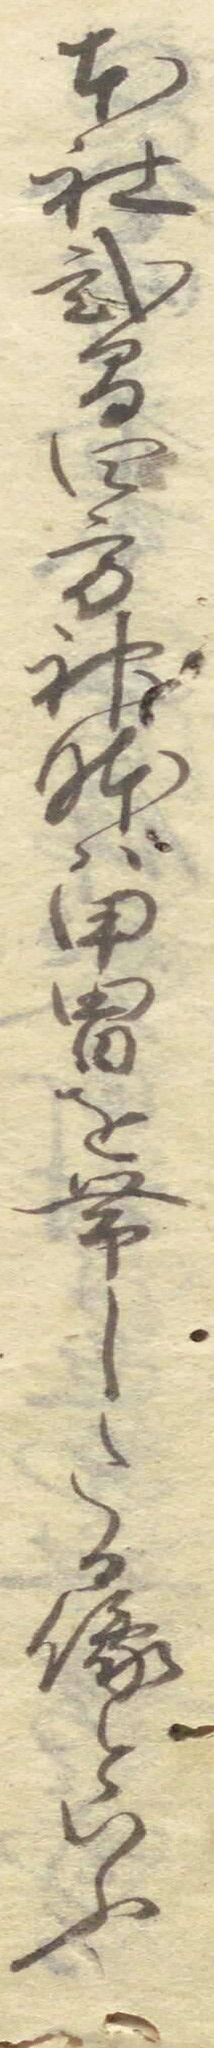本社弐間四方神体は甲冑を帯したる像といふ
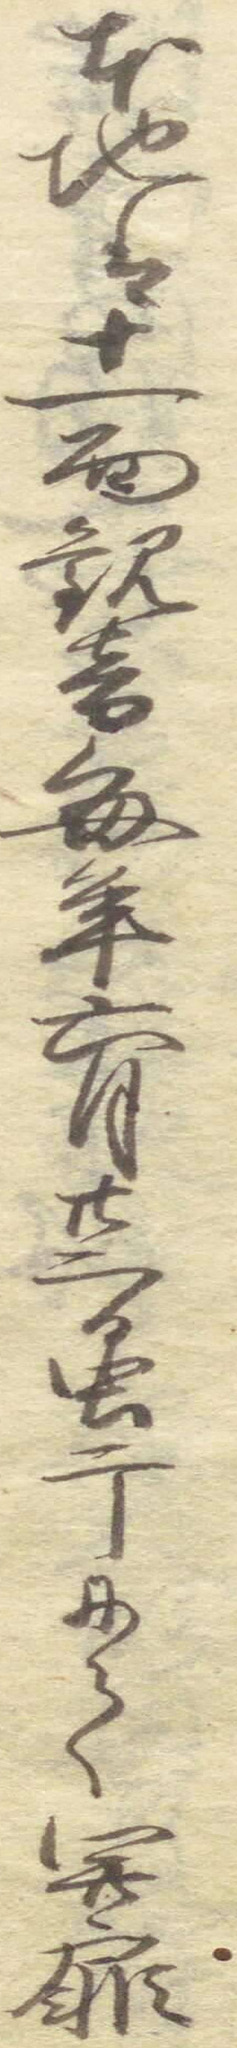本地は十一面観音毎年六月廿二日虫干にて開扉
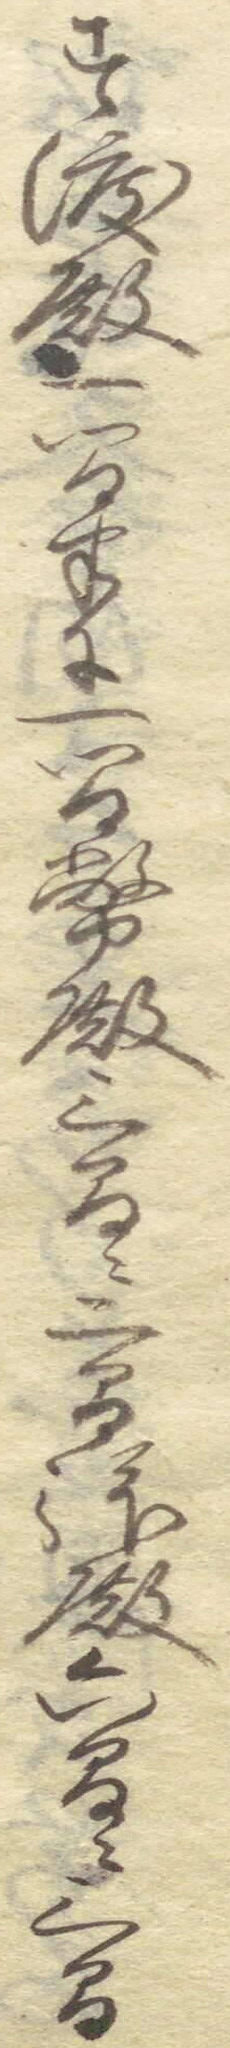す渡殿一間半に一間幣殿三間に二間拝殿六間に三間
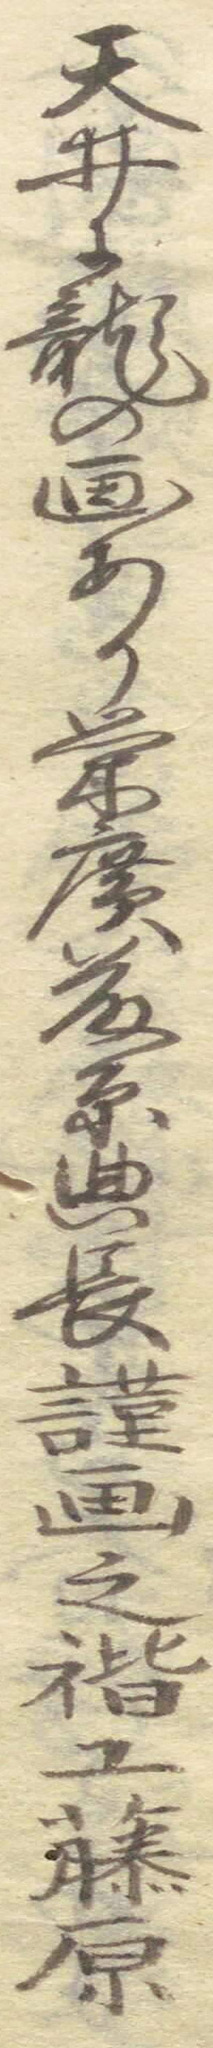天井に龍の画あり栄広藤原典長謹工楷工藤原
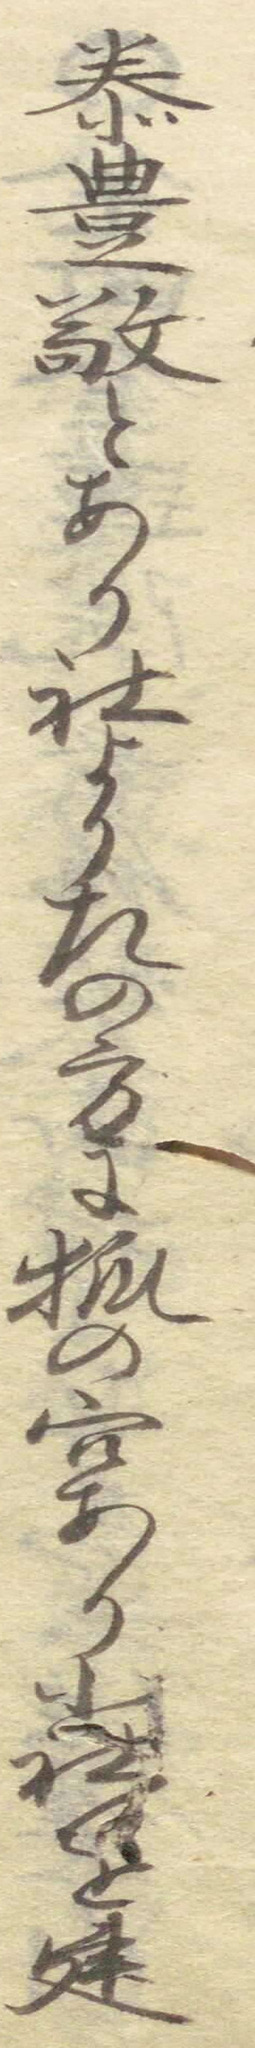泰豊敬とあり社より左の方に狐の穴あり小社を建
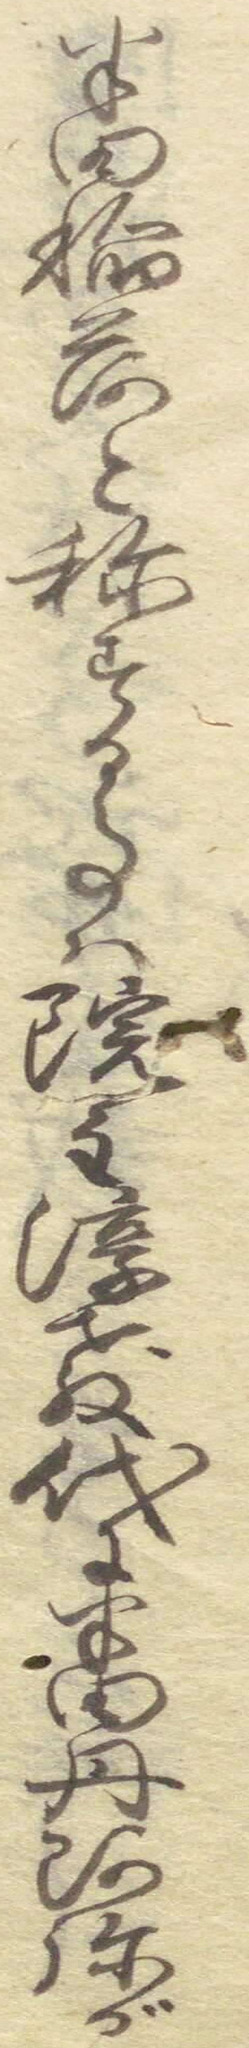半田稲荷と称する事は院主淳教代に半田丹阿弥が
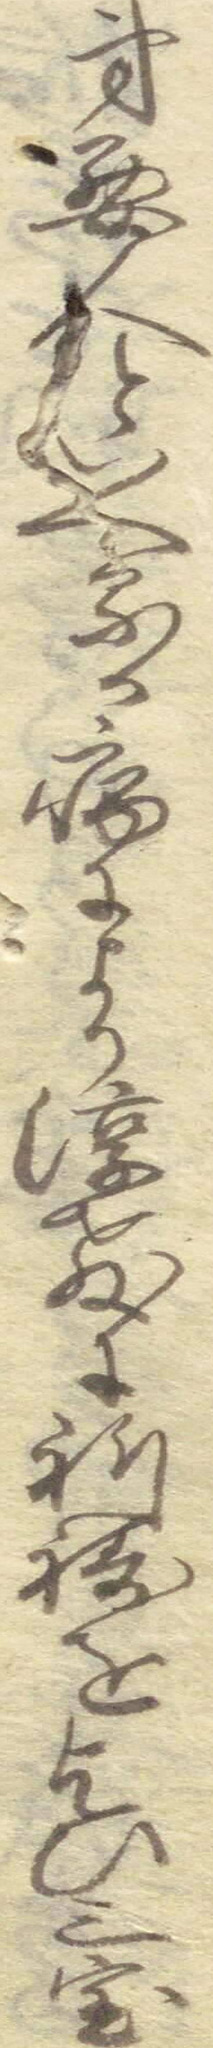弟要人といへるか病により淳教に祈祷を乞ひ三宝
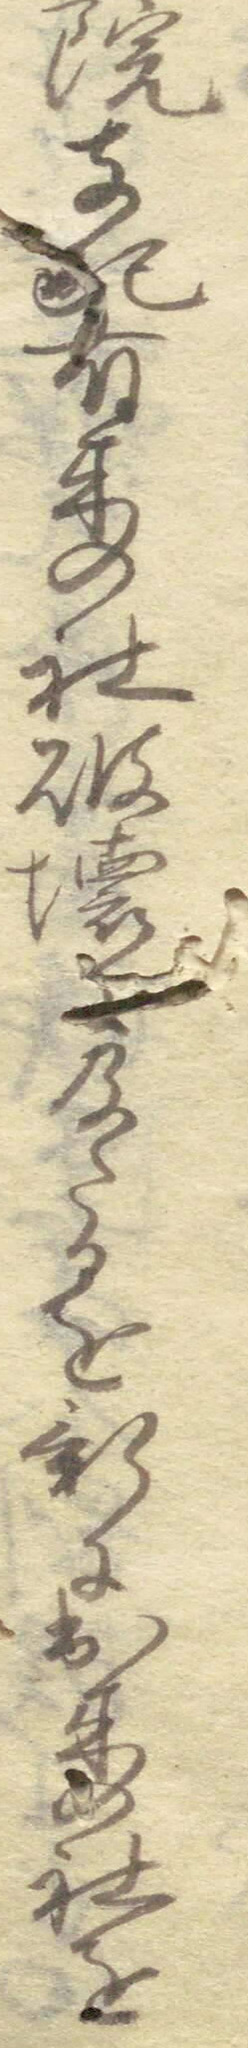院支配有来の社破壊に及たるを新に出来の社を
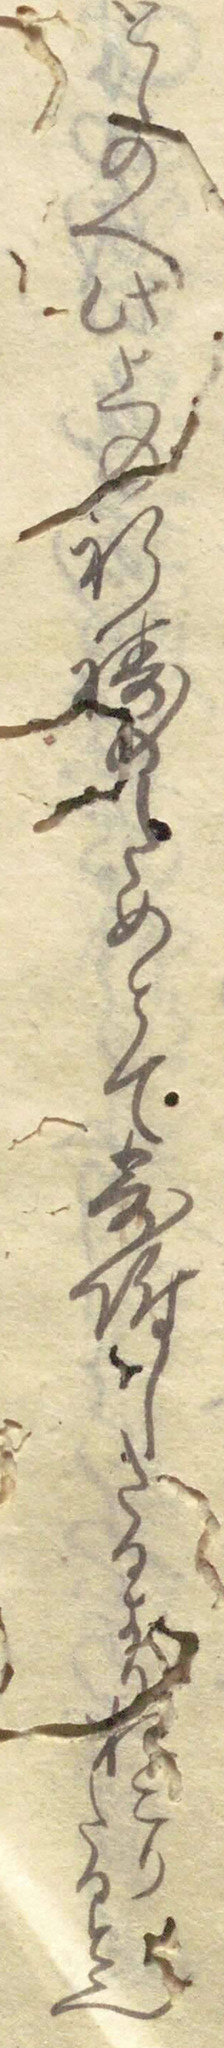とゝのへ此上の祈祷のためとて寄附したるよりおこり

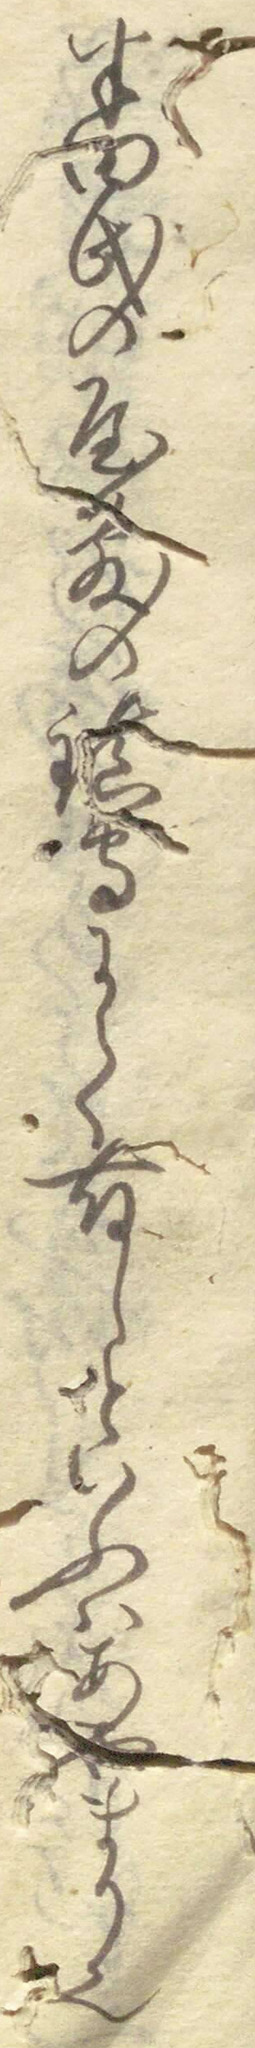半田氏の屋敷の鎮守にて有しといふはあやまり也
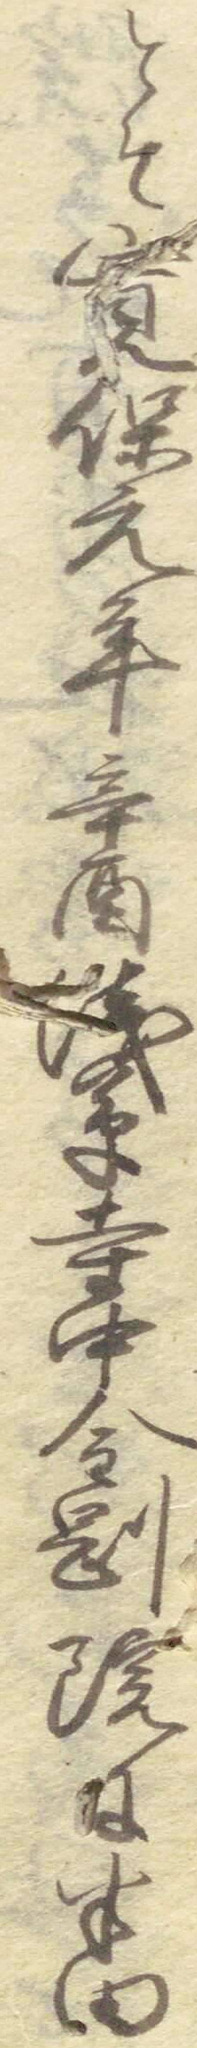とそ寛保元年辛酉浅草寺中金剛院に半田
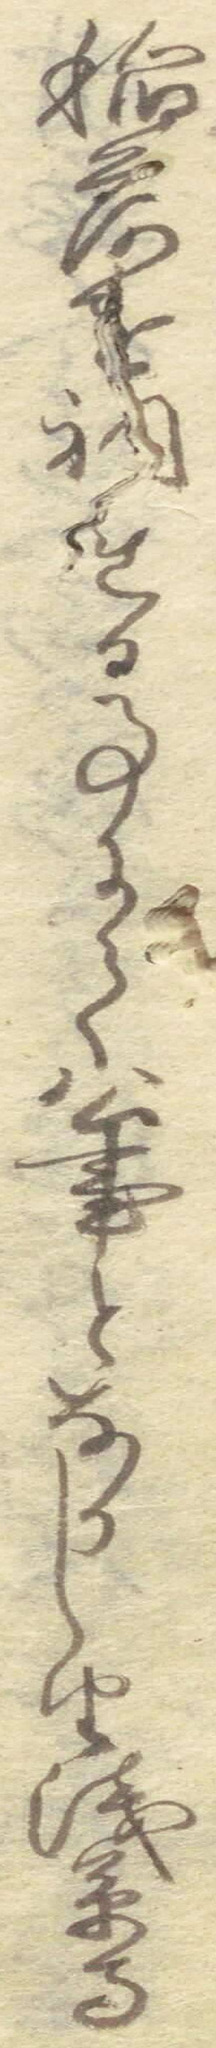稲荷を祠れる事にて公事となりし由浅草寺
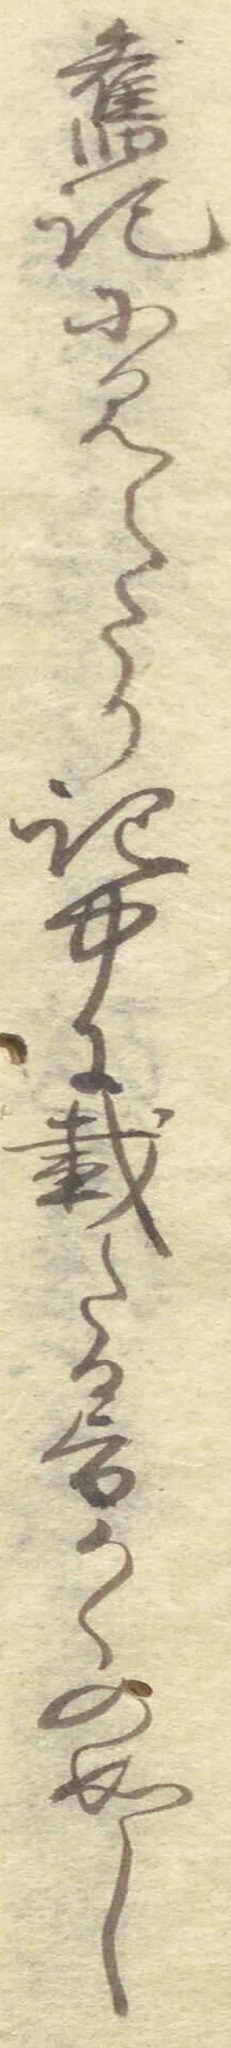旧記に見えたり記中に載たる旨かくの如し
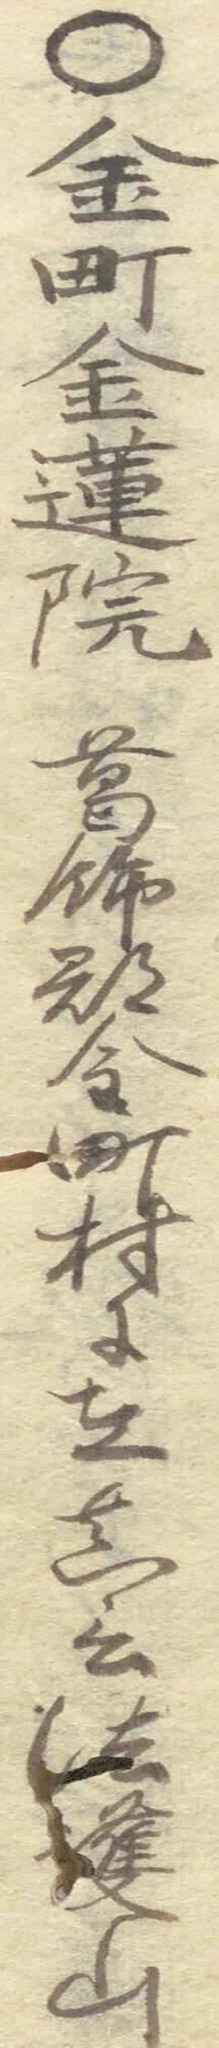○金町金蓮院葛飾郡金町村に在真言法護山
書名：四神社閣記
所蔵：茨城大学附属図書館 国文学研究資料館
